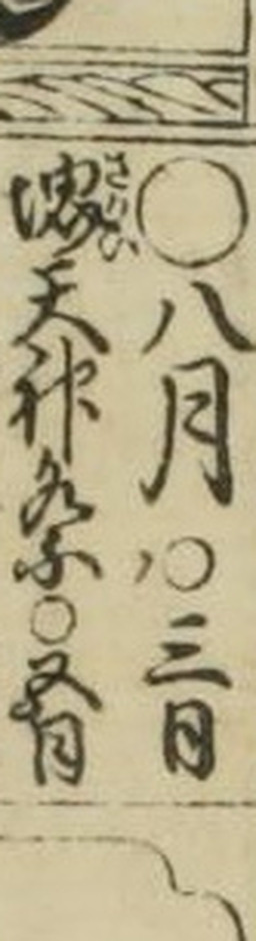堺天神祭○五日
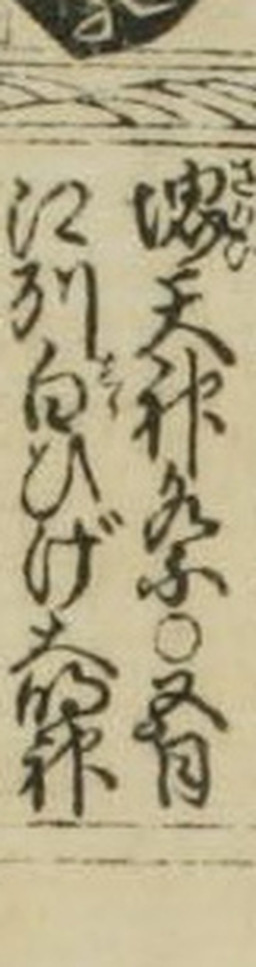江州白ひげ大明神
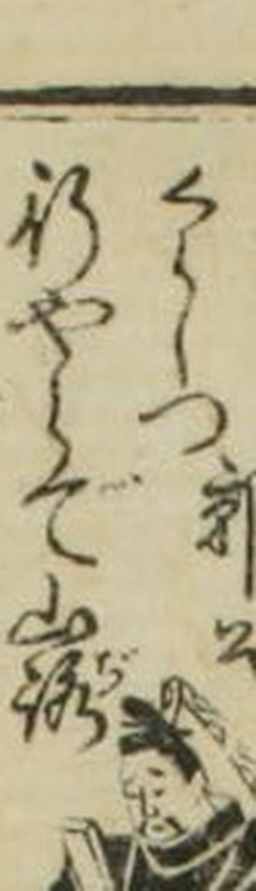行やらで山路
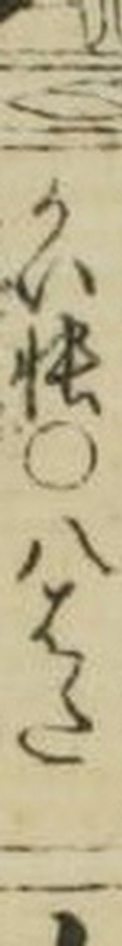かい帳○八はた
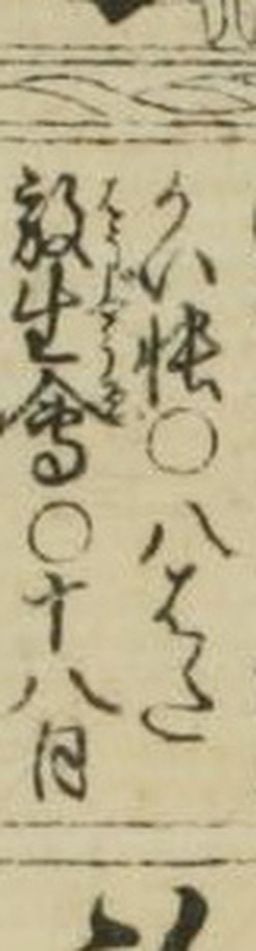放生会○十八日
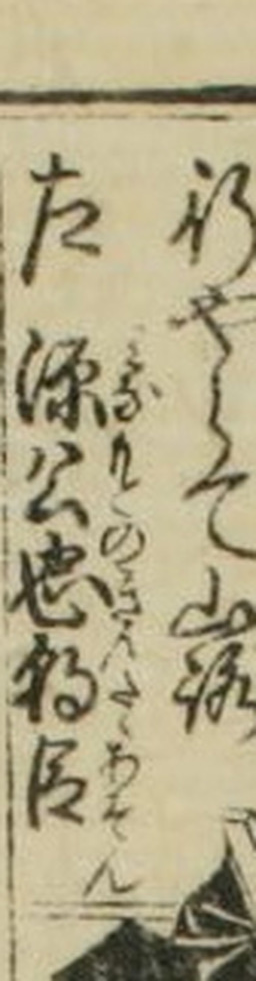左源公忠朝臣
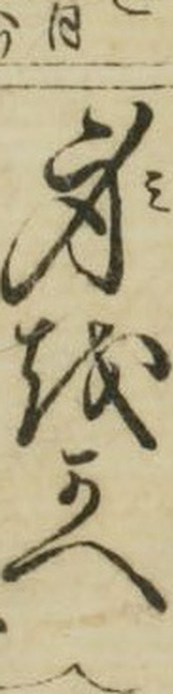身をかへ
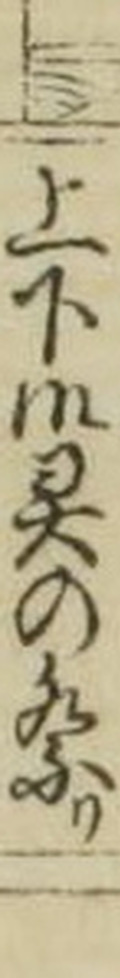上下御霊の祭り
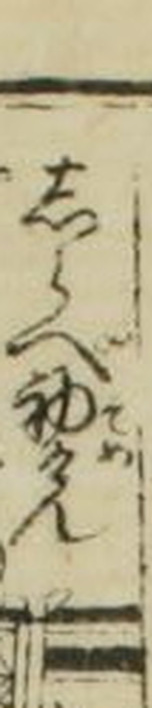しらべ初けん
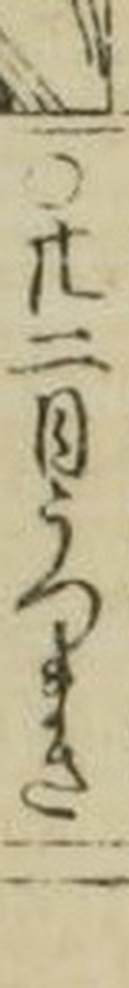○廿二日うつまさ
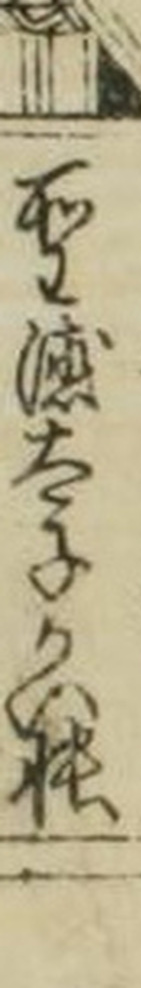聖徳太子かい帳
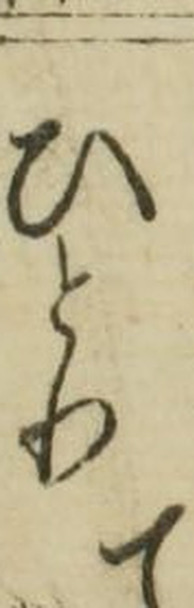ひとり
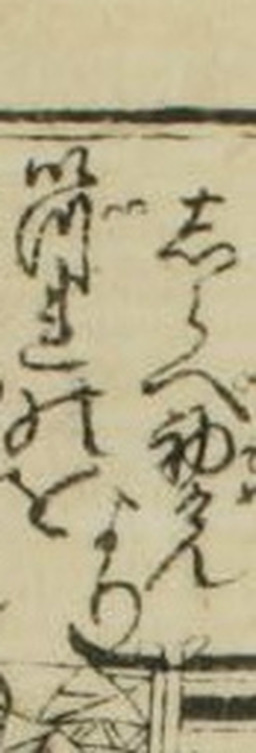いづれのを
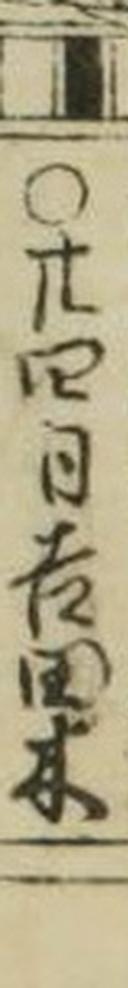○廿四日吉田木
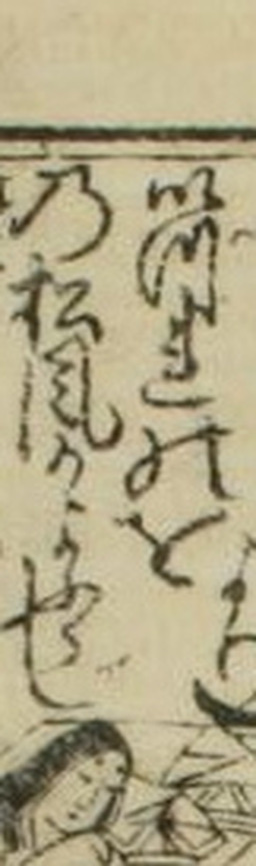の松風かよふらし
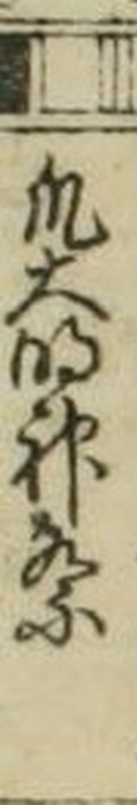瓜大明神祭
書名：女源氏教訓鑑
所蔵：東京学芸大学附属図書館
